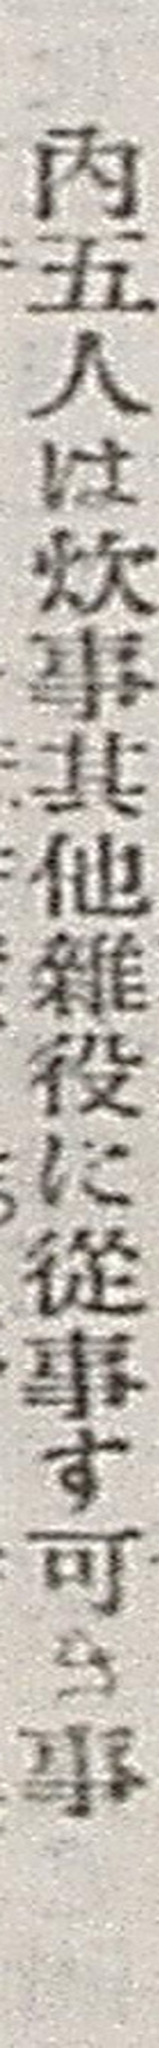内五人は炊事其他雑役に従事す可き事
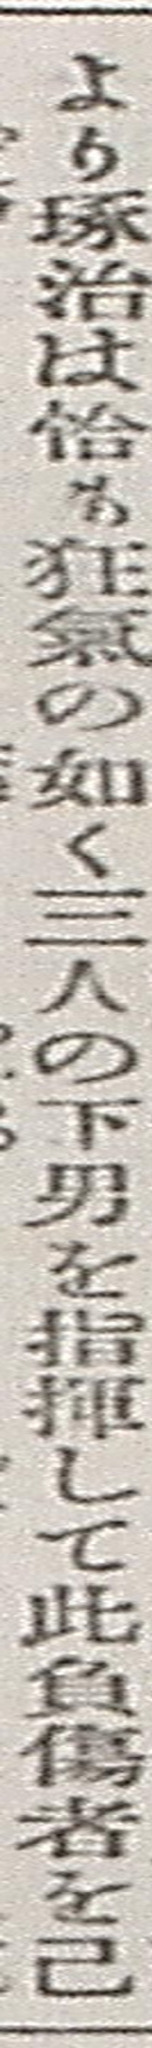より琢治は恰も狂気の如く三人の下男を指揮して此負傷者を己
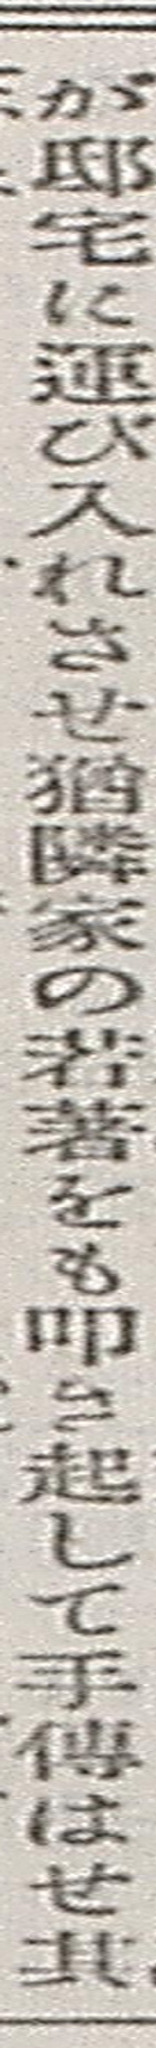が邸宅に運び入れさせ猶隣家の若著をも叩き起して手伝はせ其
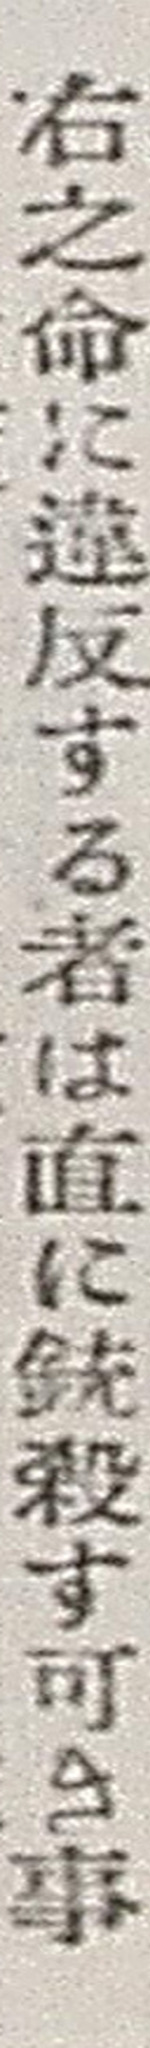右之命に違反する者は直に銃殺す可き事
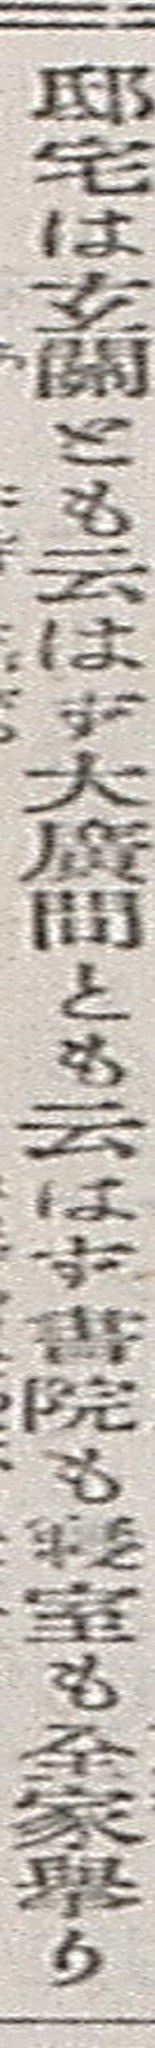邸宅は玄関とも云はず大広間とも云はず書院も寝室も全家挙り
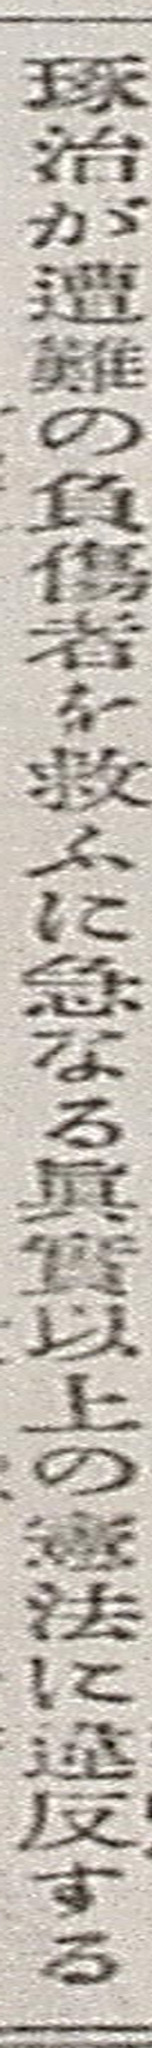琢治が遭難の負傷者を救ふに急なる真実以上の憲法に違反する
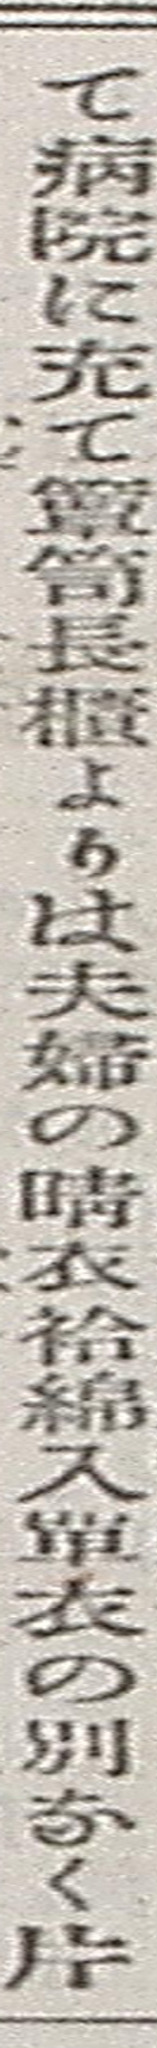て病院に充て箪笥長櫃よりは夫婦の晴衣袷綿入単衣の別なく片
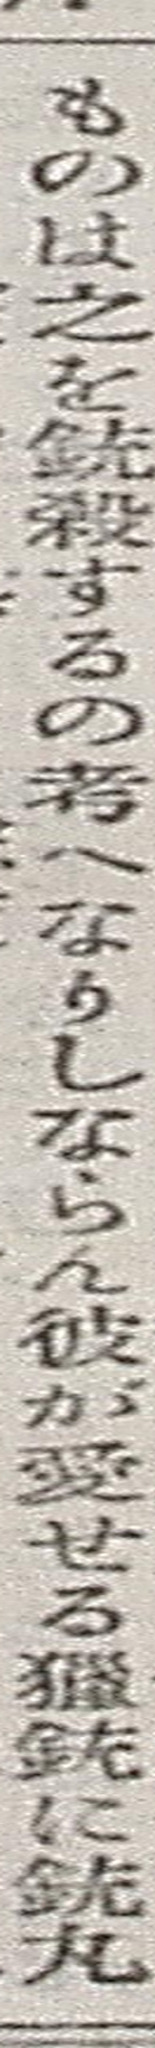ものは之を銃殺するの考へなりしならん彼が愛せる猟銃に銃丸
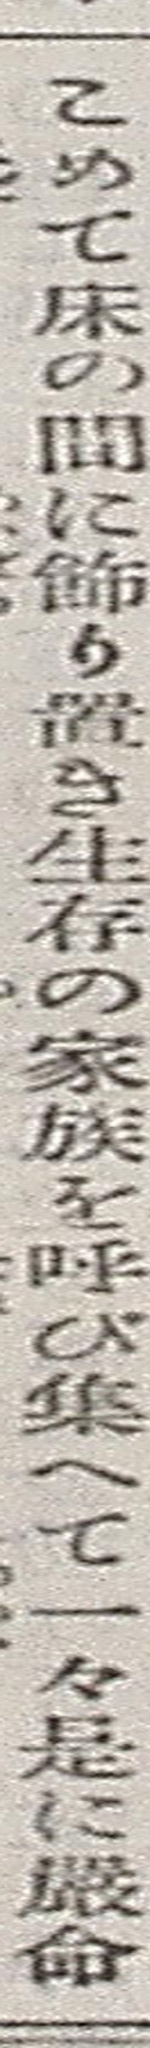こめて床の間に飾り置き生存の家族を呼び集へて一々是に厳命
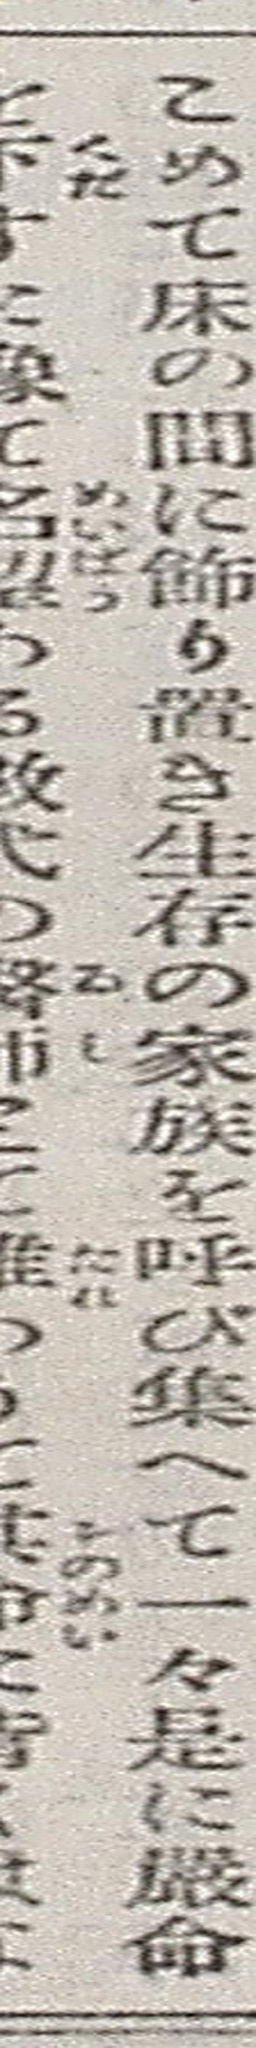を下すに予て名望ある数代の医師とて誰ありて其命に背くはな
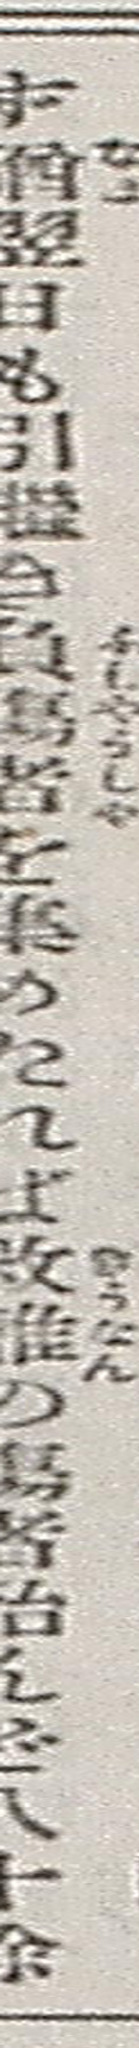ず猶翌日も引継き負傷者を集めたれば救難の傷者殆んど八十余
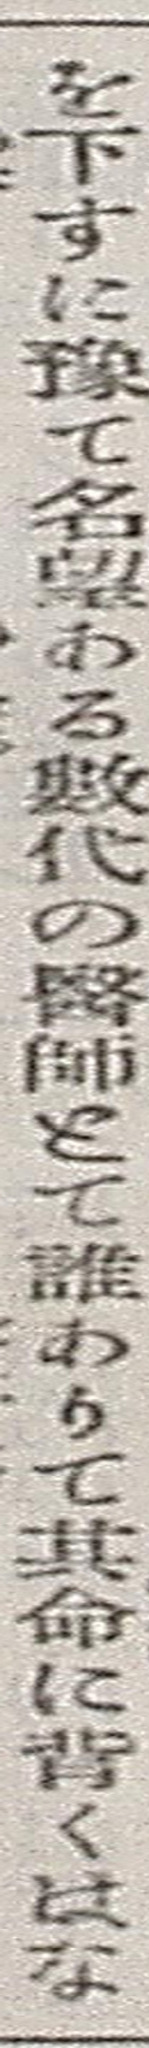を下すに予て名望ある数代の医師とて誰ありて其命に背くはな
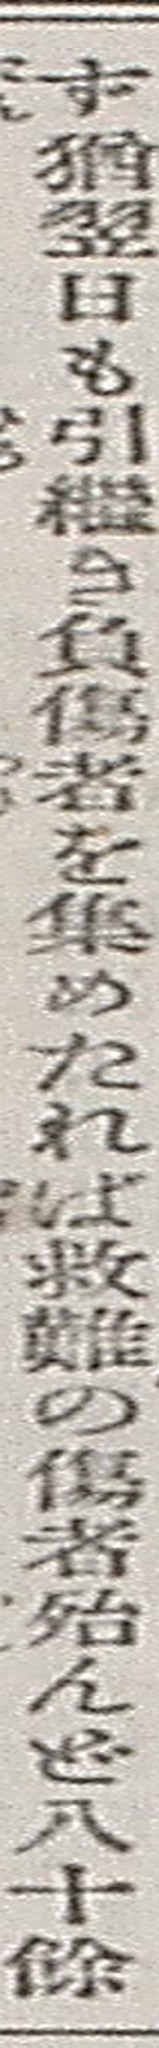ず猶翌日も引継き負傷者を集めたれば救難の傷者殆んど八十余
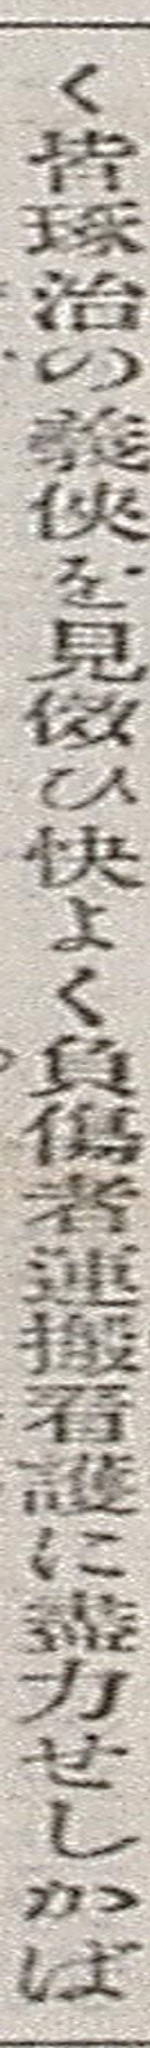く皆琢治の義侠を見倣ひ快よく負傷者運搬看護に尽力せしかば
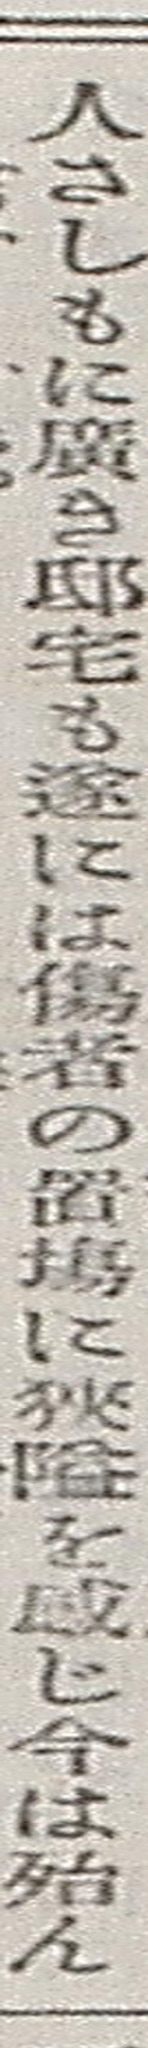人さしもに広き邸宅も遂には傷者の置場に狭隘を感じ今は殆ん
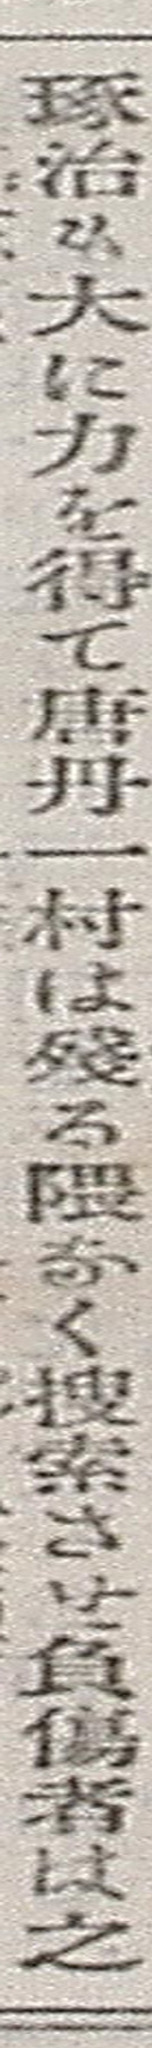琢治も大に力を得て唐丹一村は残る隈なく捜索させ負傷者は之
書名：風俗畫報臨時増刊第百二十號　大海嘯被害録（下）
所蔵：東京大学地震研究所図書室 Earthquake Research Institute Library, The University of Tokyo, JAPAN
